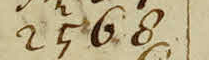2568
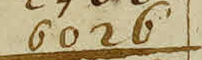6026
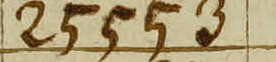25553
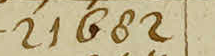21682
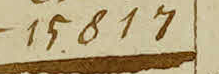15817
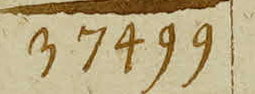37499
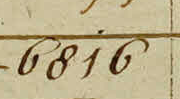6816
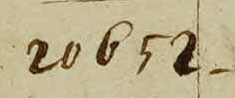20652
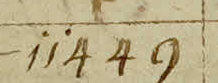11449
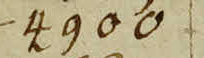4900
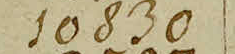10830
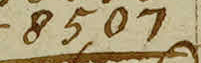8507
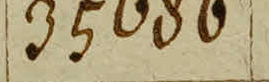35686
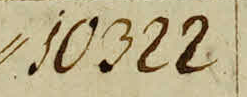10322
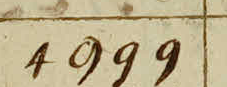4999
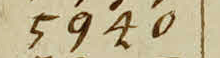5940
